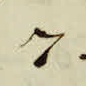7
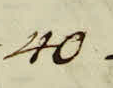40
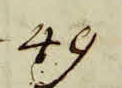49
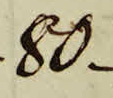80
